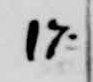17
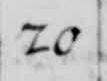20
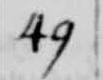49
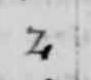2
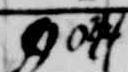904
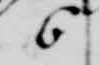6
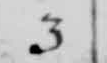3
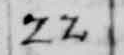22
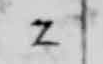2
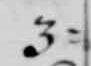3
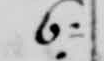6
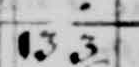133
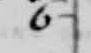6
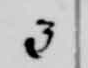3
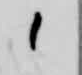1
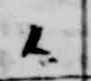1
